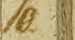10.
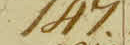147.
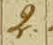2.
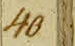40
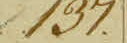137.
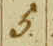5.
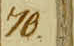70.
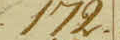172.
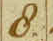8.
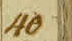40
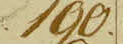190.
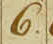6.
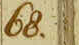68.
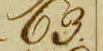63.
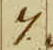7.
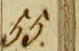55.
